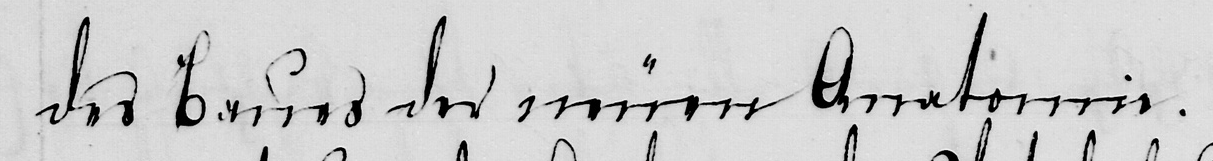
des Baues der neuen Anatomie.
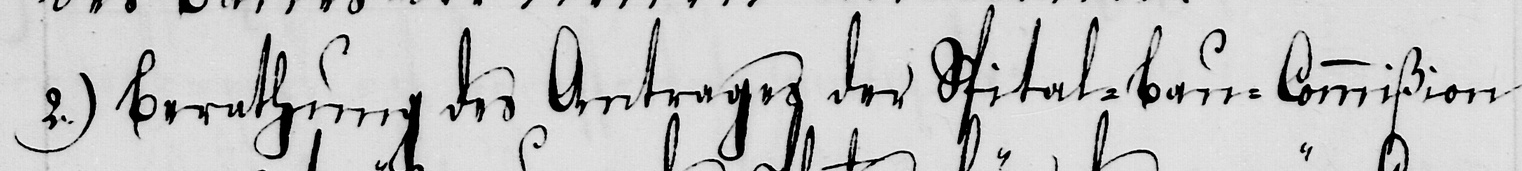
2.) Berathung des Antrages der Spital-Bau-Commißion
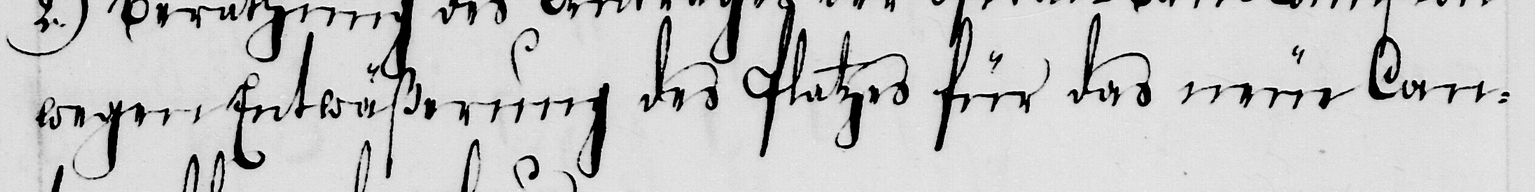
wegen Entwäßerung des Platzes für das neue Can¬
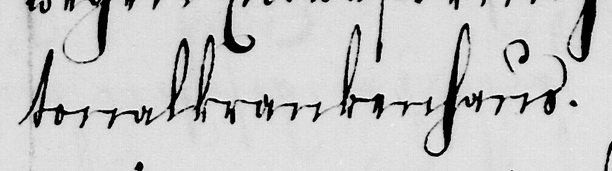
tonalkrankenhaus.
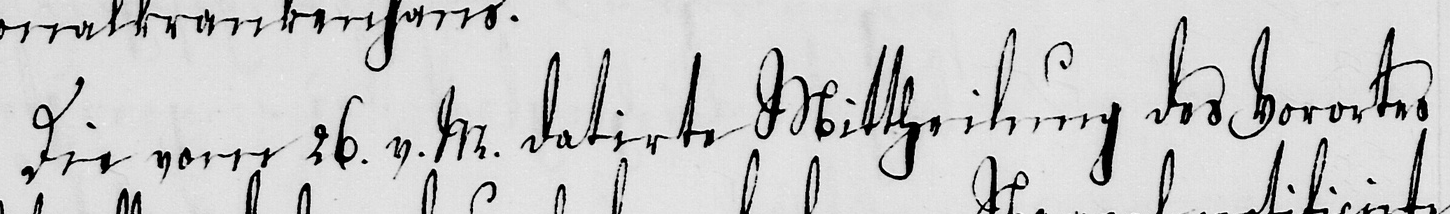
Die vom 26. v. M. datirte Mittheilung des Vorortes
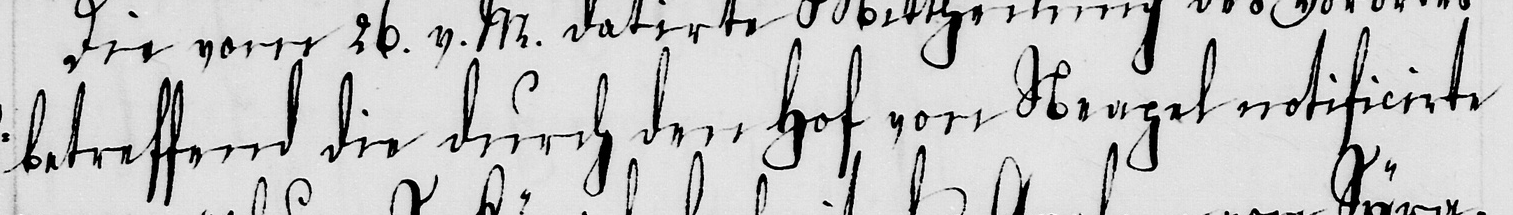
betreffend die durch den Hof von Neapel notificirte
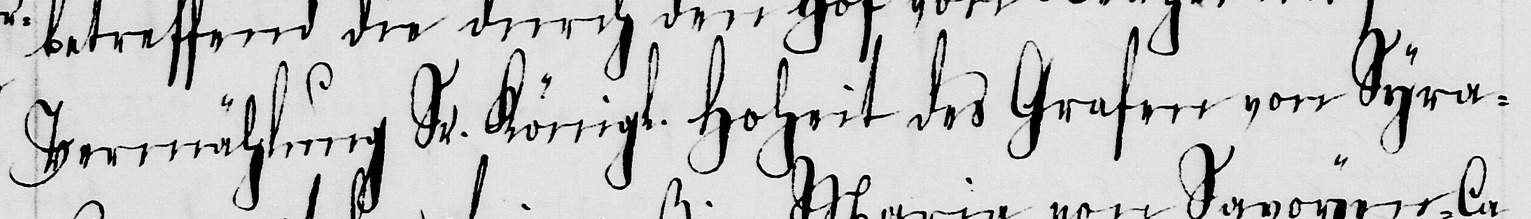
Vermählung Sr. Königl. Hoheit des Grafen von Syra¬
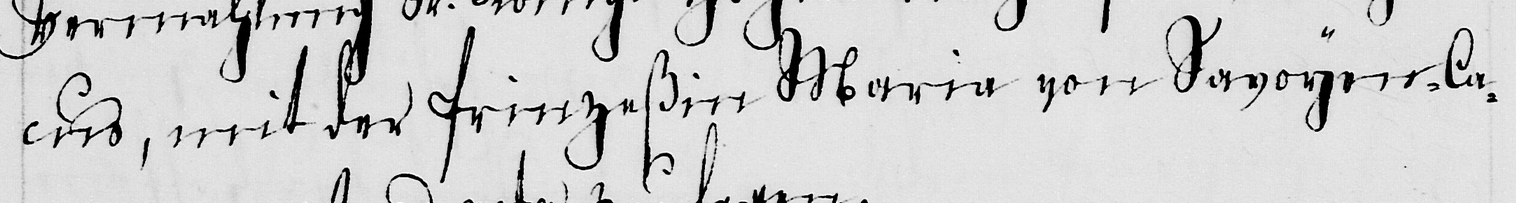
cus, mit der Prinzeßin Maria von Savoyen-Ca¬
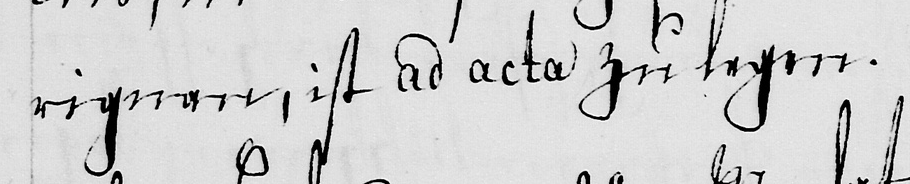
rignan, ist ad acta zu legen.
